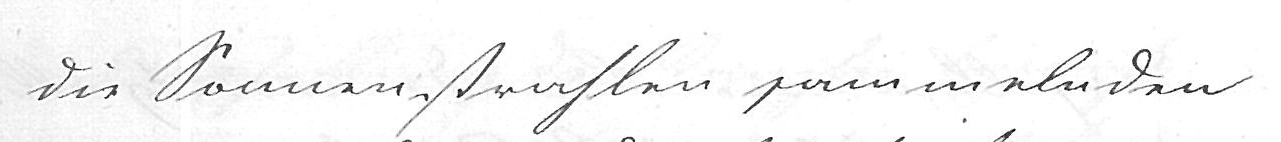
die Sonnenstrahlen sammelnden
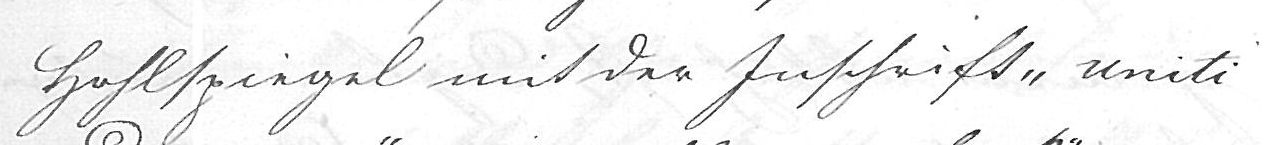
Hohlspiegel mit der Inschrift "uniti
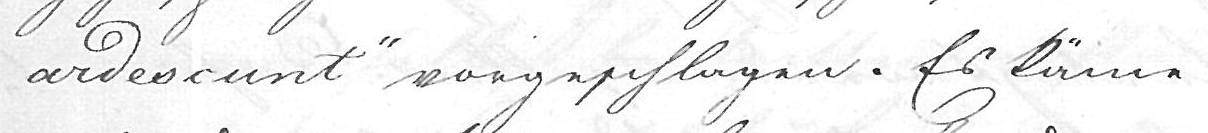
ardescunt" vorgeschlagen. Es käme
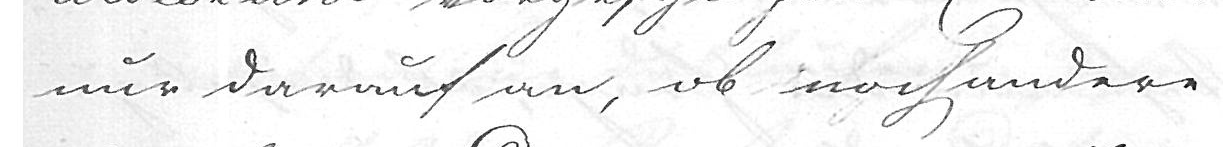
nur darauf an, ob noch andere
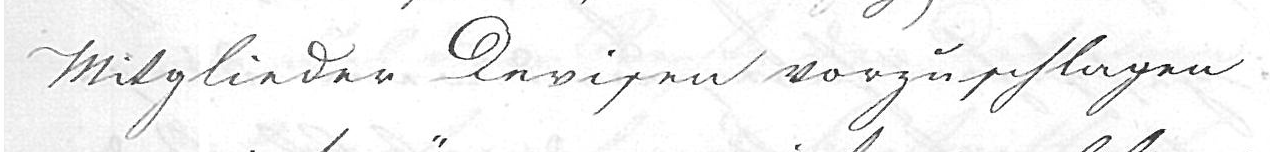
Mitglieder Devisen vorzuschlagen
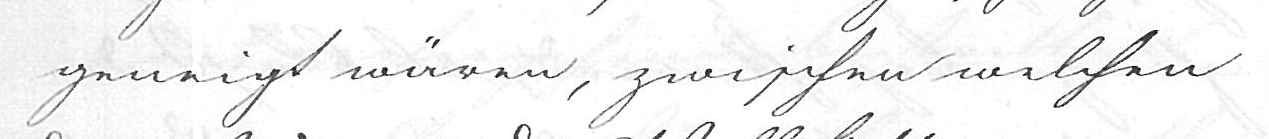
geneigt wären, zwischen welchen
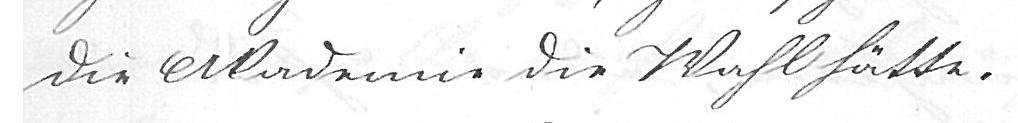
die Akademie die Wahl hätte.
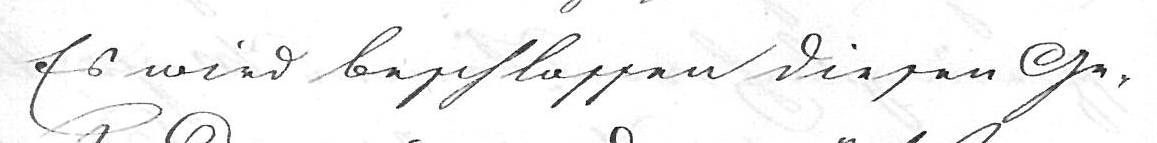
Es wird beschlossen diesen Ge-
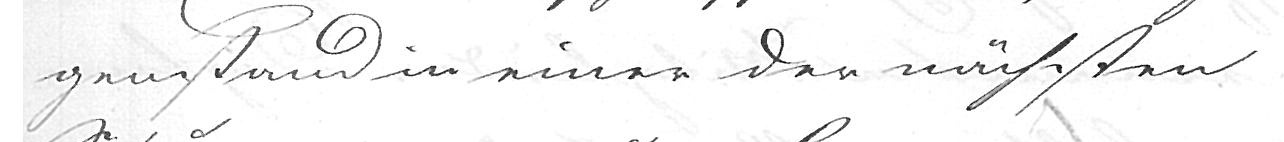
genstand in einer der nächsten
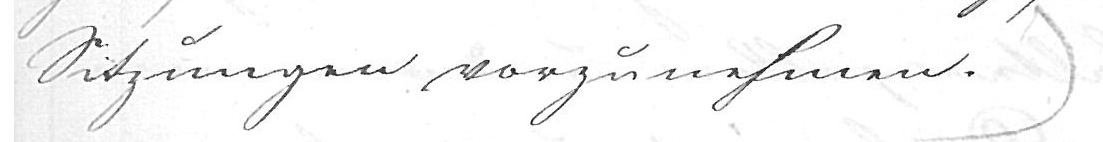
Sitzungen vorzunehmen.
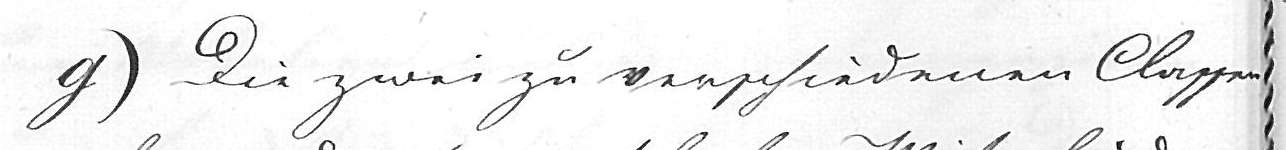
g) Die zwei zu verschiedenen Classen
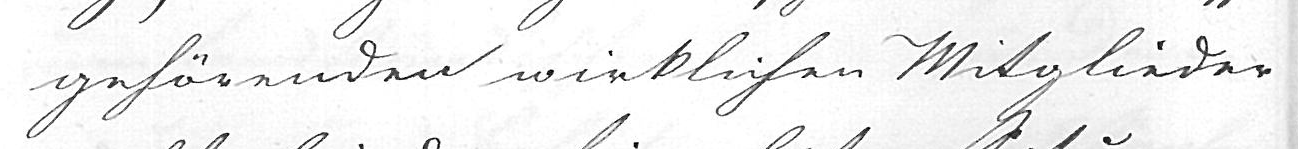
gehörenden wirklichen Mitglieder,
